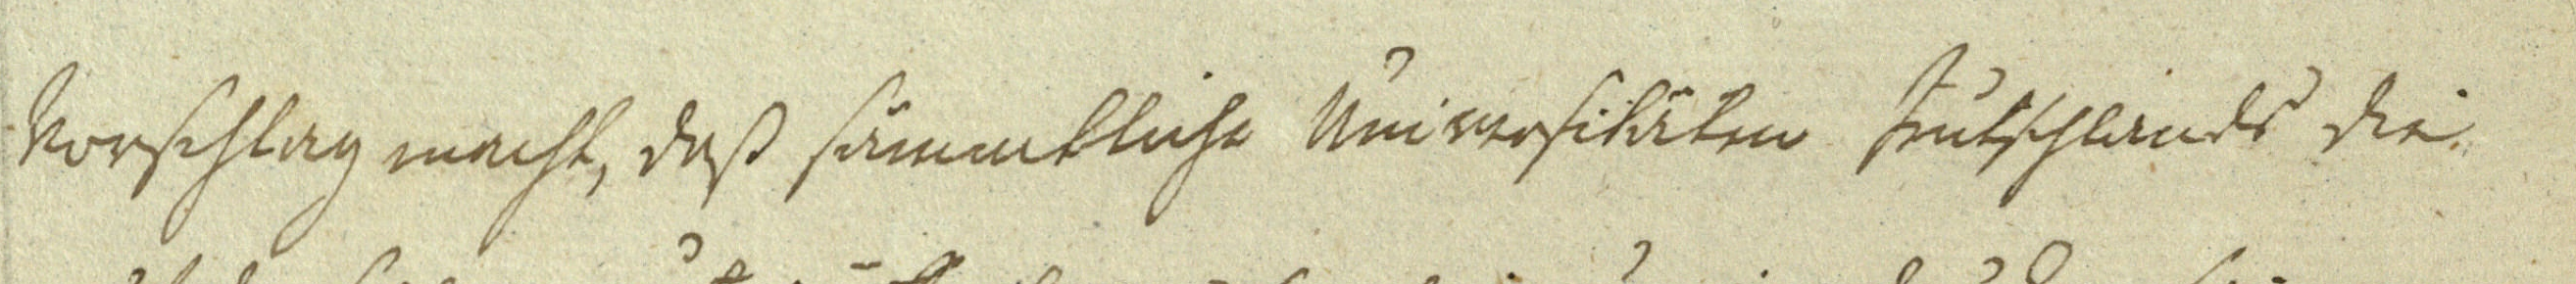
Vorschlag macht, daß sämmtliche Universitäten Teutschlands die
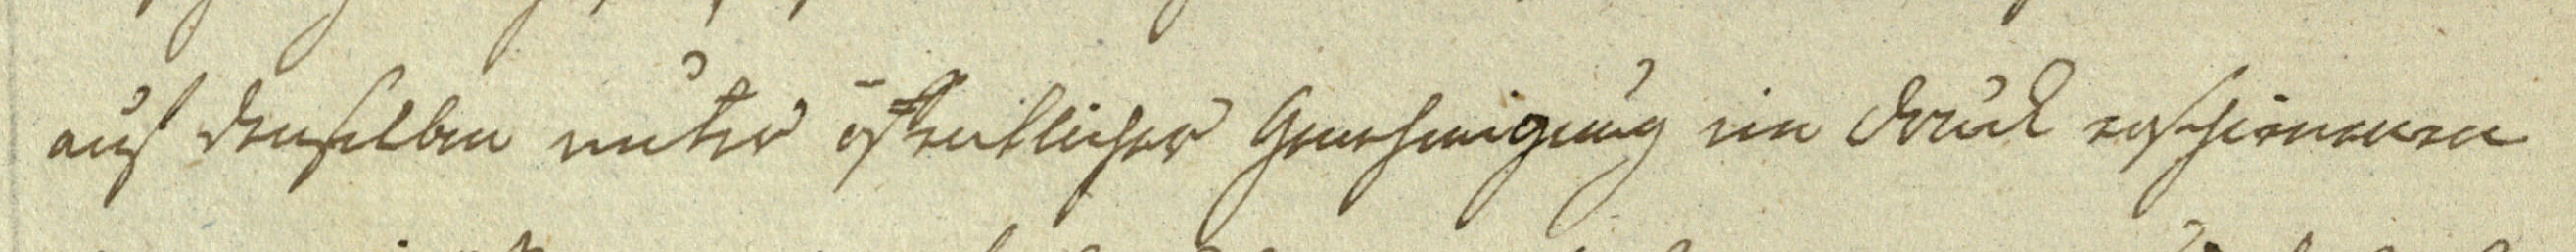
auf denselben unter öffentlicher Genehmigung im Druck erschienenen
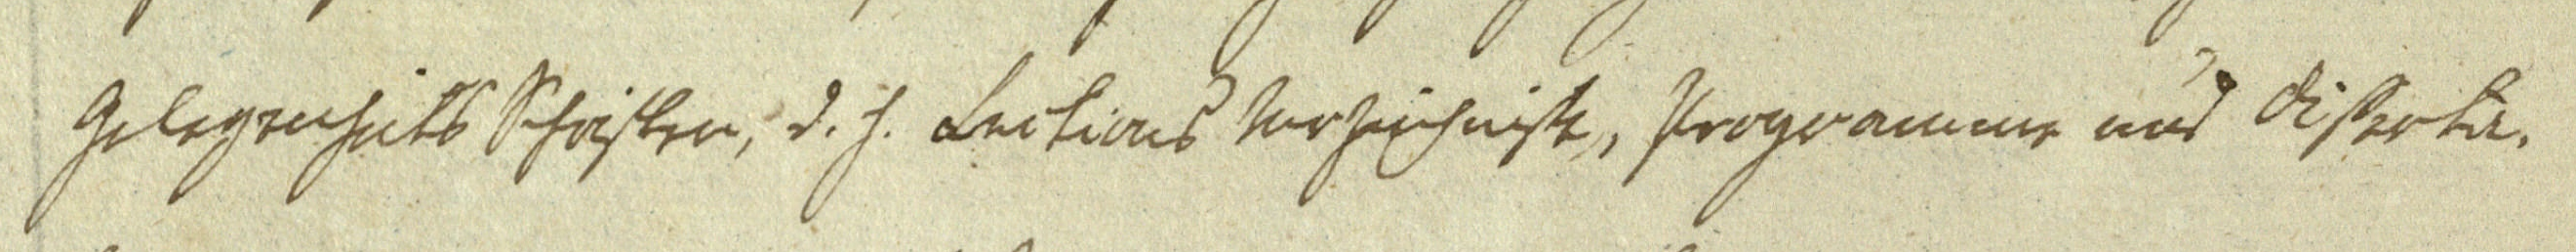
Gelegenheits Schriften, d. J. Lections Verzeichniße, Programme und Disserta¬
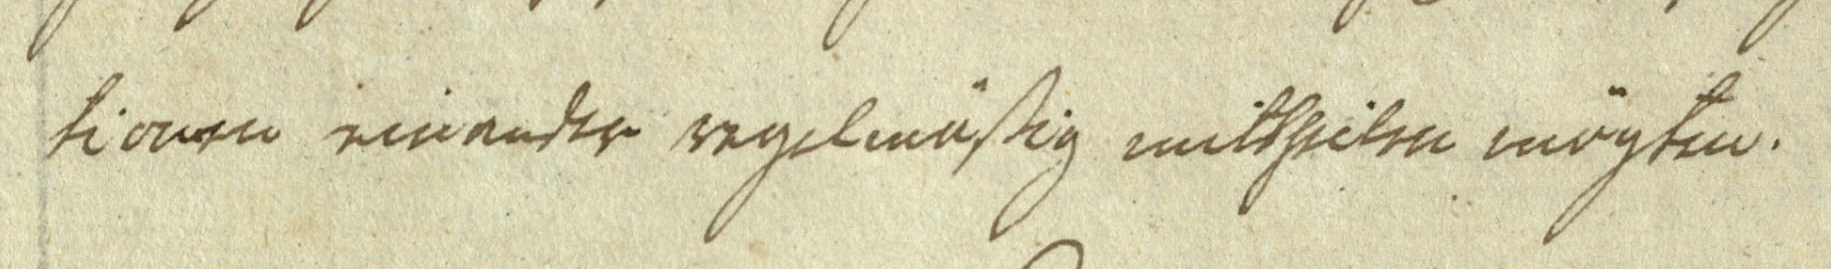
tionen einander regelmäßig mittheilen mögten.
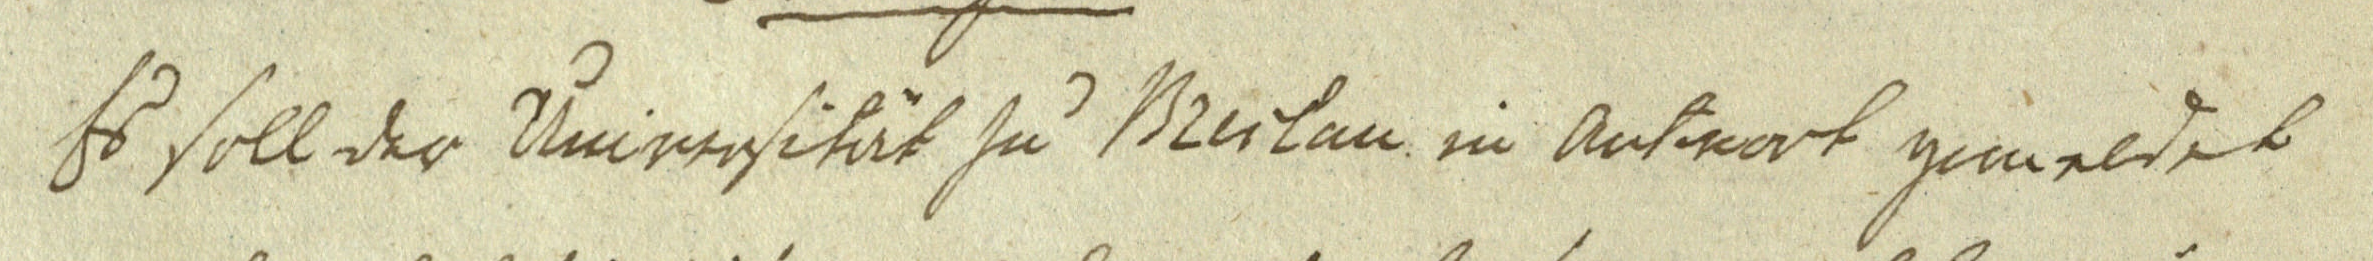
Es soll der Universität zu Breslau in Antwort gemeldet
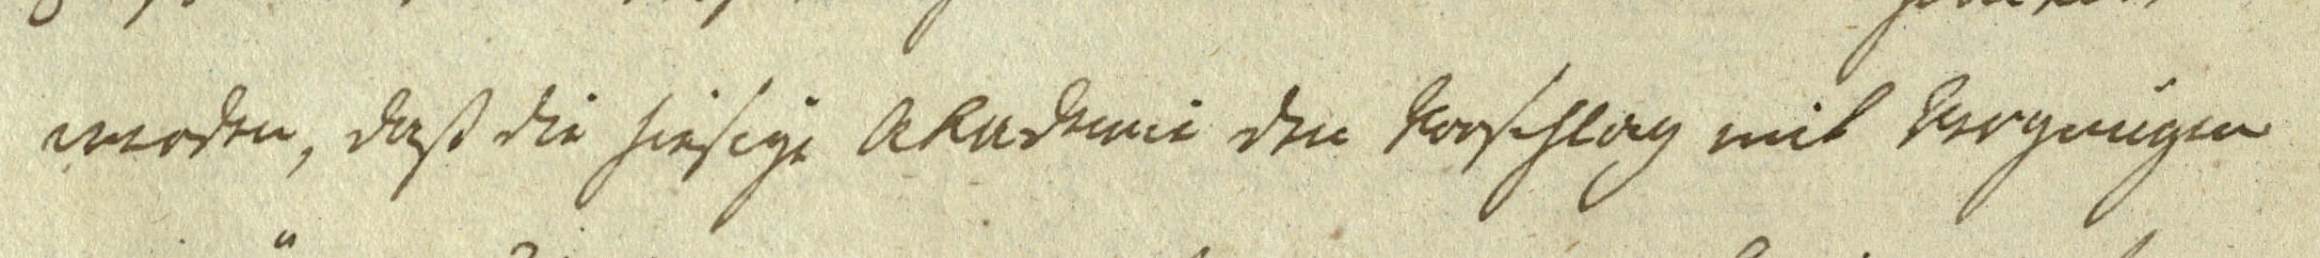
werden, daß die hiesige Akademie den Vorschlag mit Vergnügen
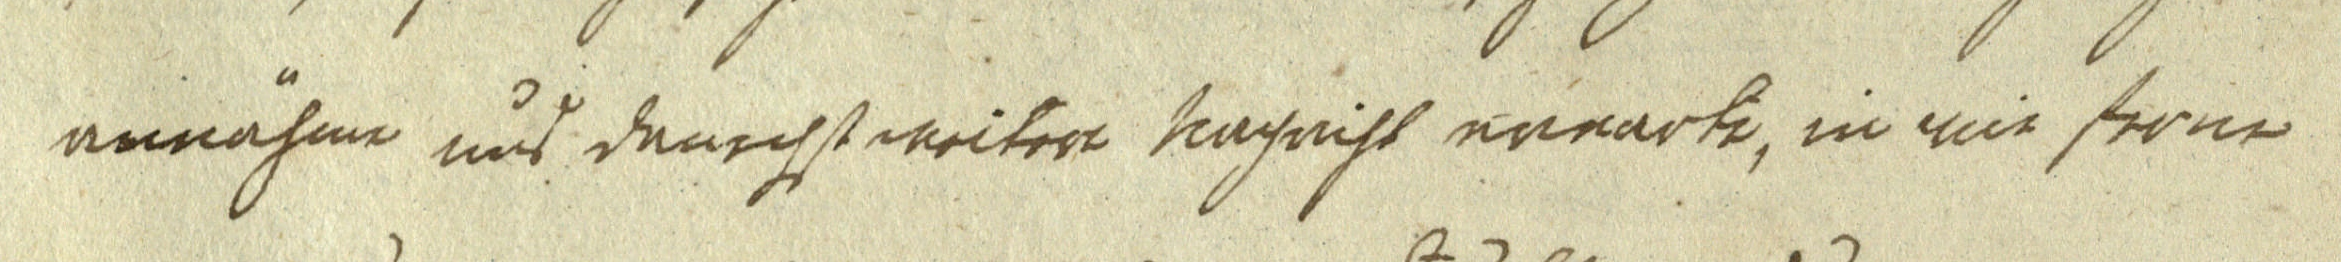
annähme und danechst weitere Nachricht erwarte, in wie ferne
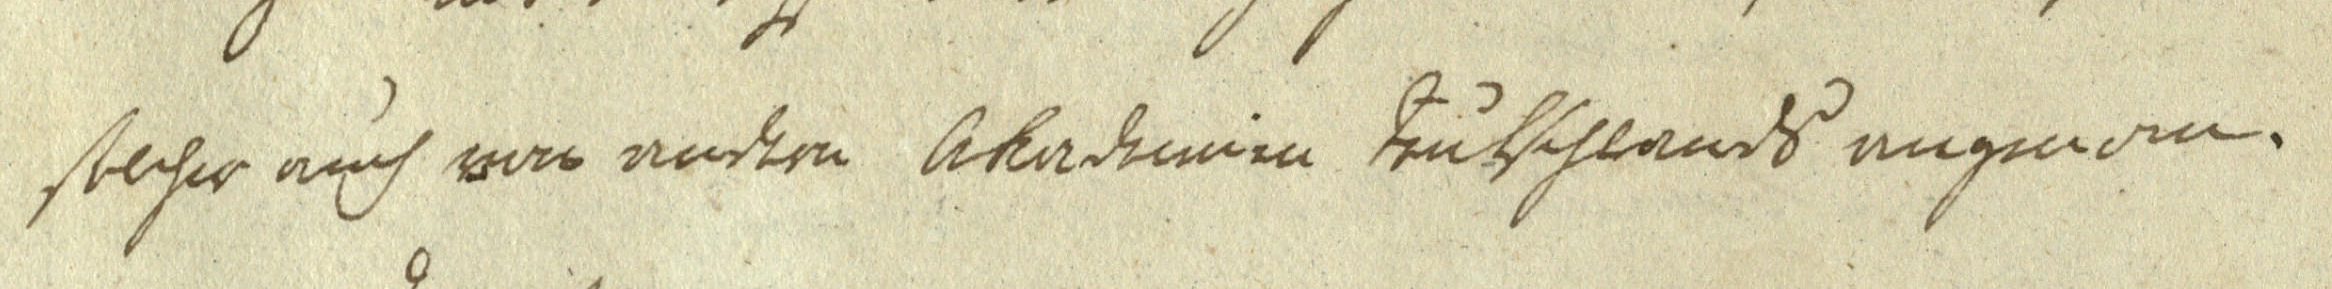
solcher auch von andern Akademien Teutschlands angenom¬
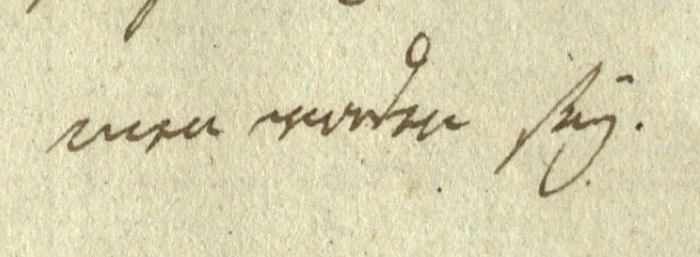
men worden seÿ.
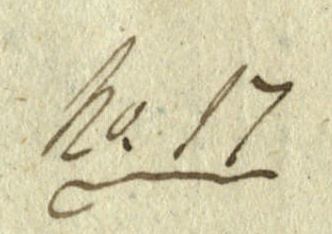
No 17.
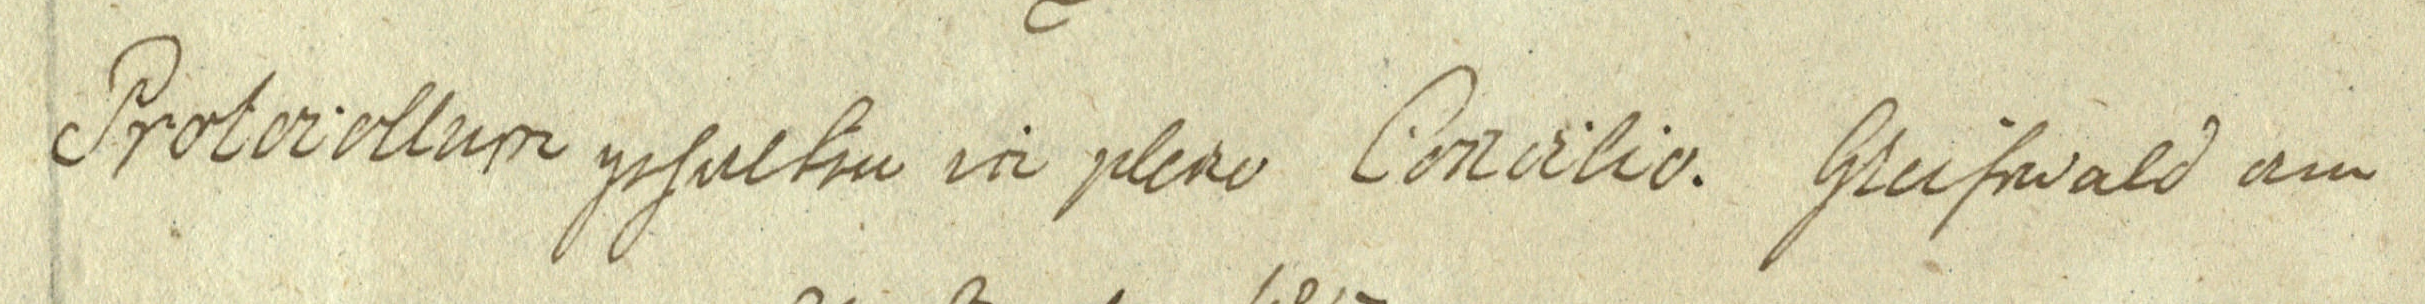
Protocollum gehalten in pleno Concilio. Greifswald am
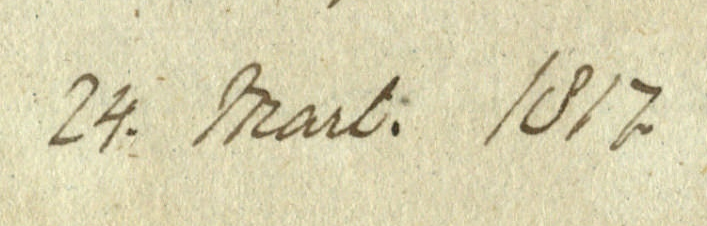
24. Mart. 1817.
